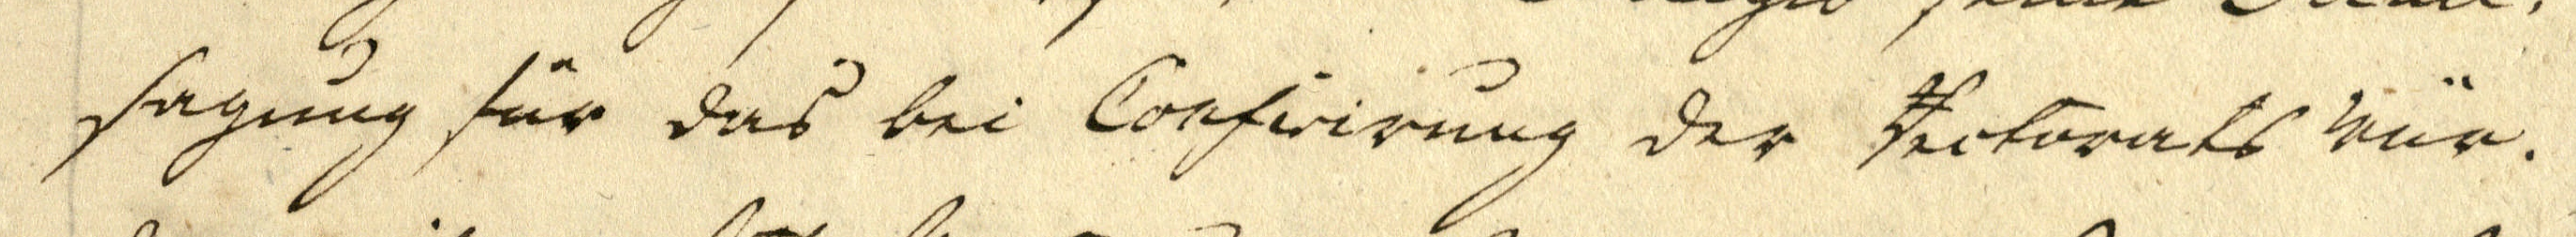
sagung für das bei Conferirung der Rectorats wür¬
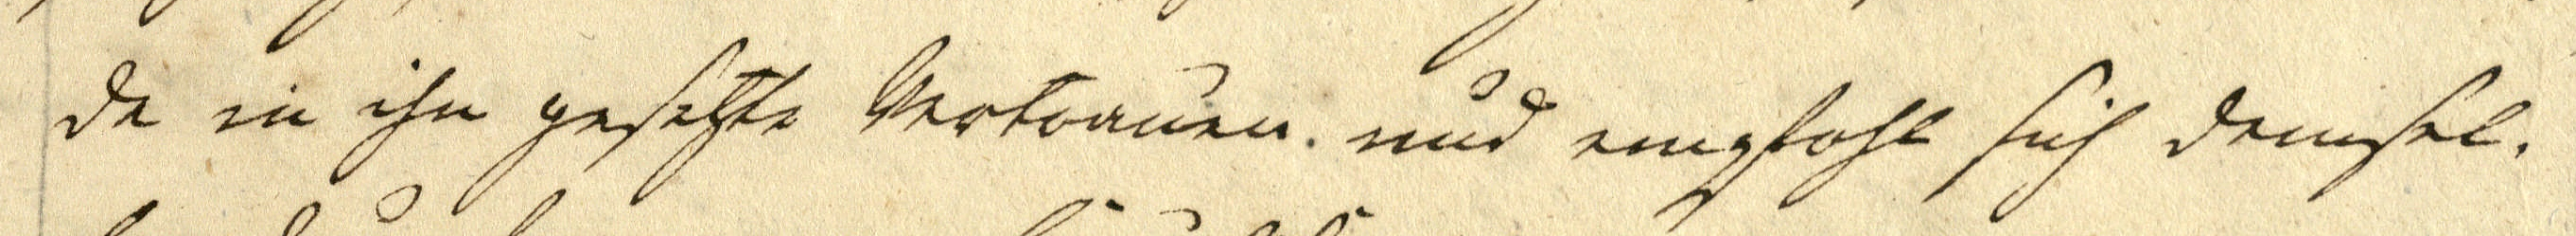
de in ihn gesetzte Vertrauen und empfahl sich demsel¬
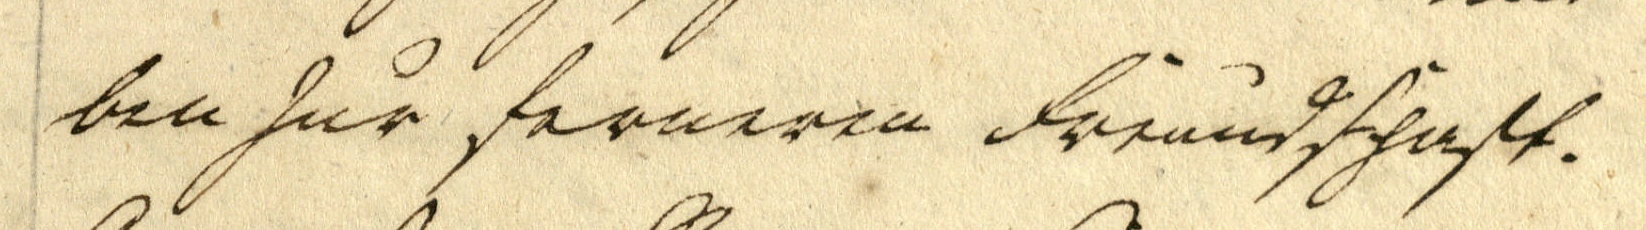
ben zur ferneren Freundschaft.
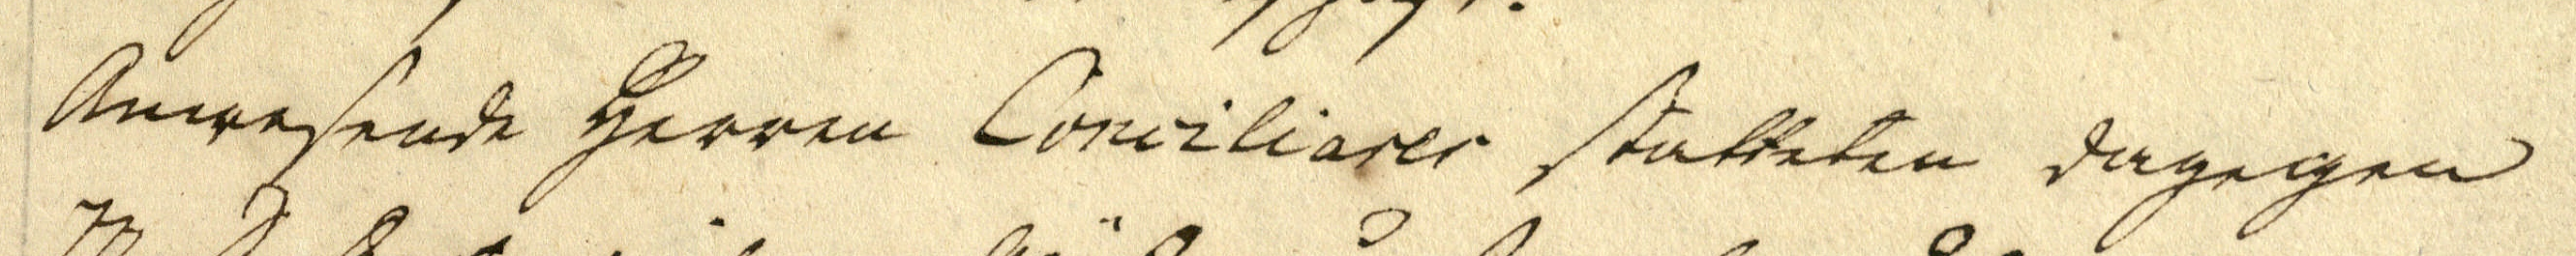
Anwesende Herren Conciliares statteten dagegen
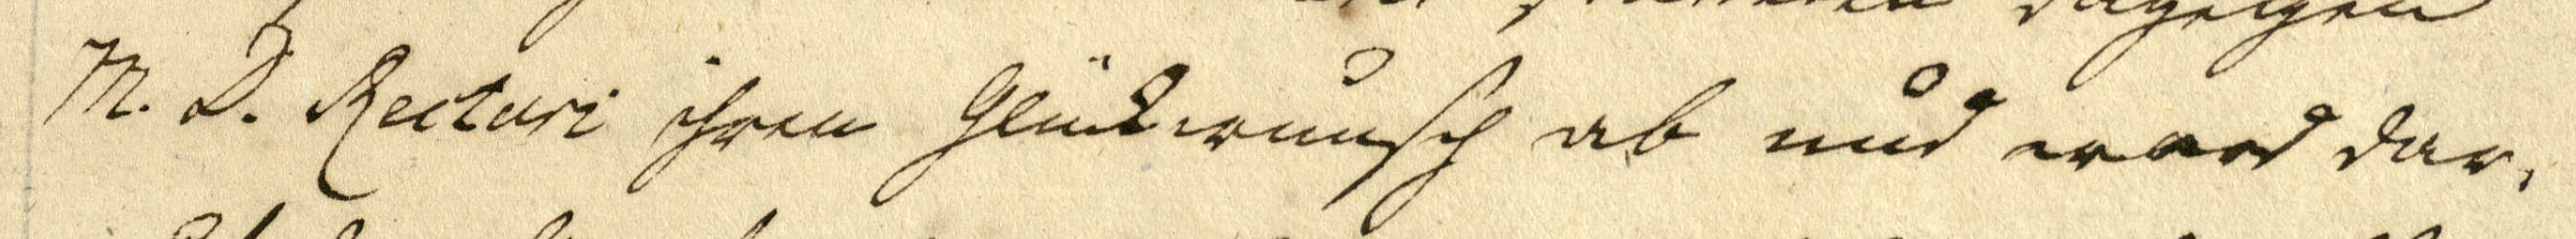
M. D . Rectori ihren Glückwunsch ab und ward dar¬
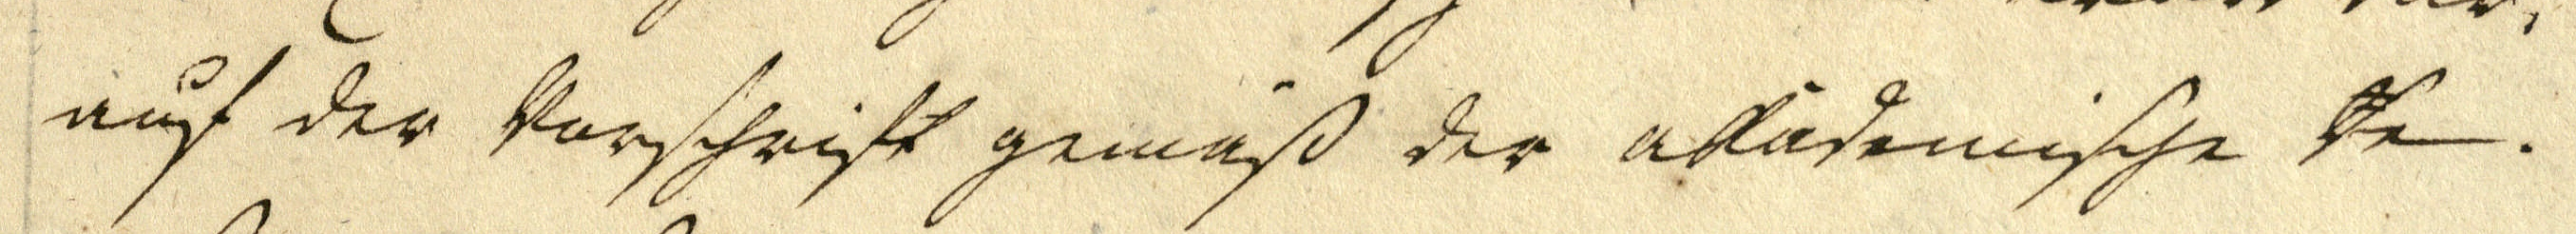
auf der Vorschrift gemäß der akademische Re¬
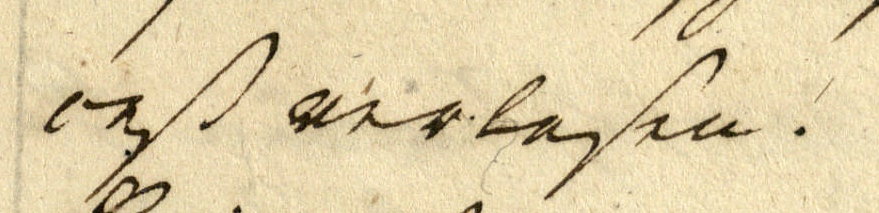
ceß verlesen.
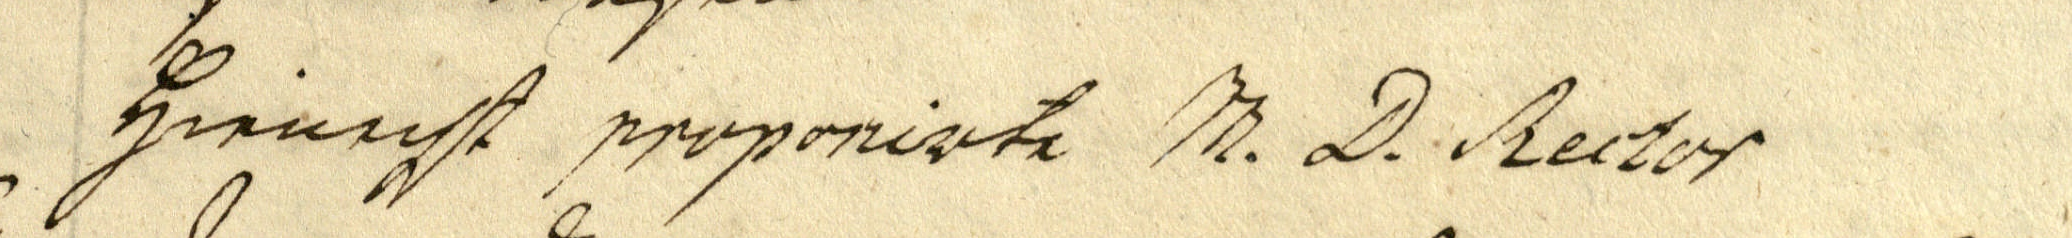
Hienechst proponirte M . D . Rector
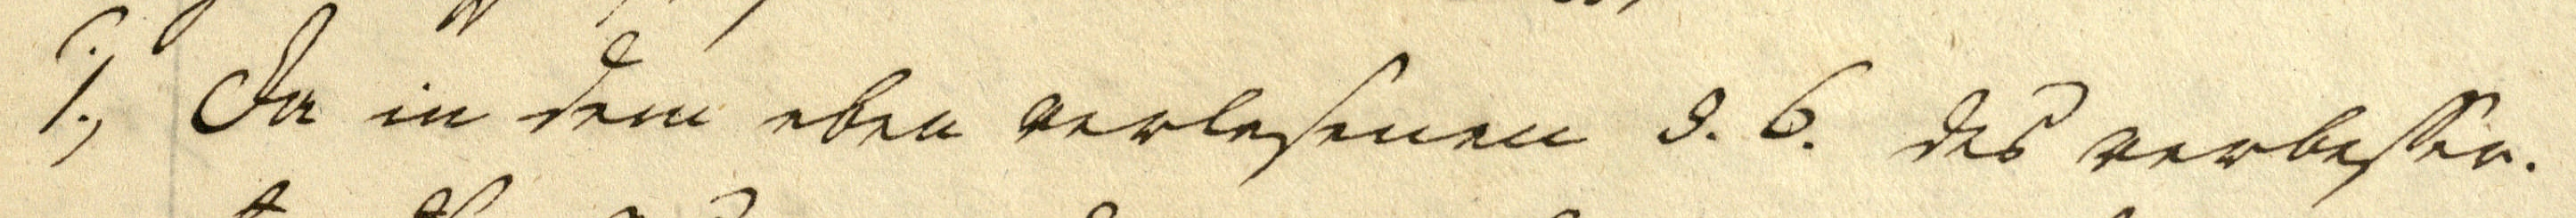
1., Da in dem eben verlesenen §. 6. des verbesser¬
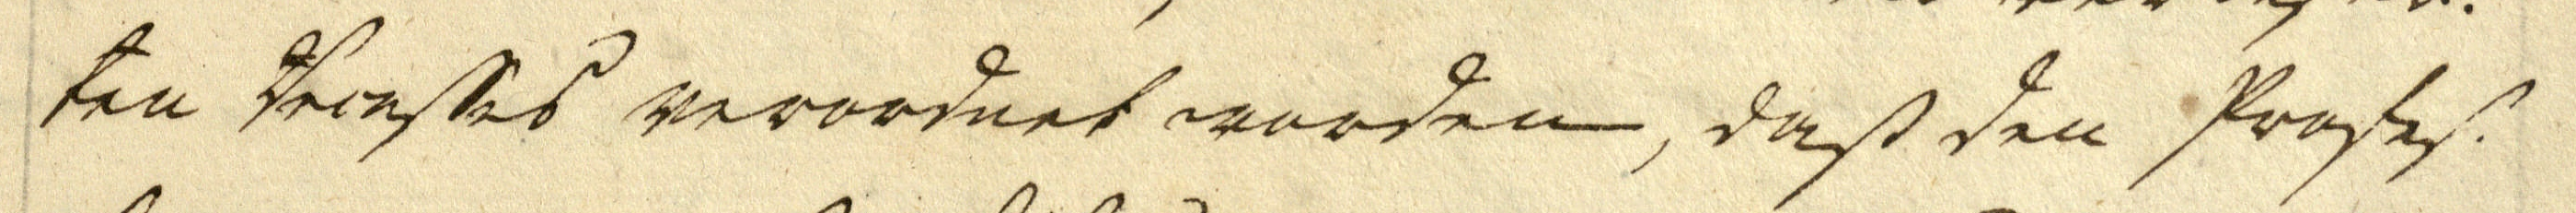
ten Recesses verordnet worden , daß den Profes¬
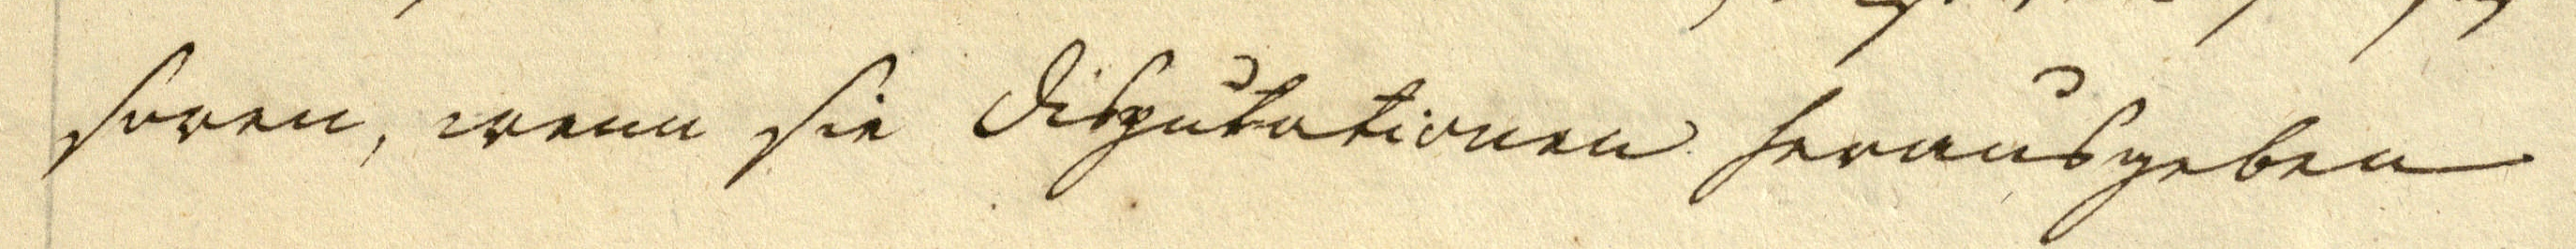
soren, wenn sie Disputationen herausgeben
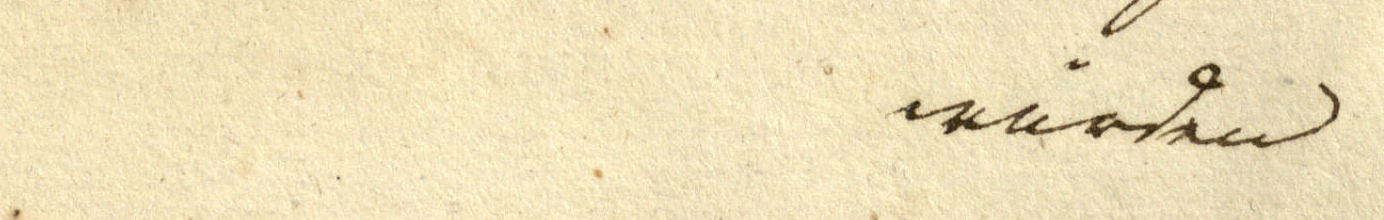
würden
